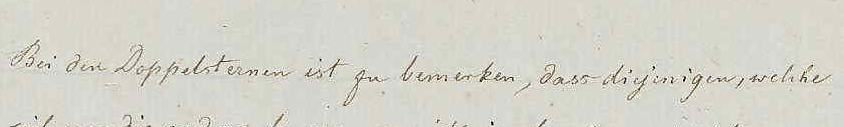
Bei den Doppelsternen ist zu bemerken, dass diejenigen, welche
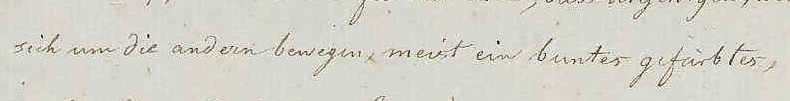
sich um die andern bewegen, meist ein buntes gefärbtes,
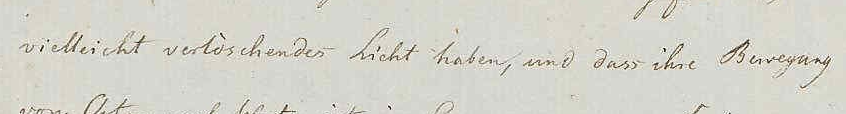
vielleicht verlöschendes Licht haben, und dass ihre Bewegung
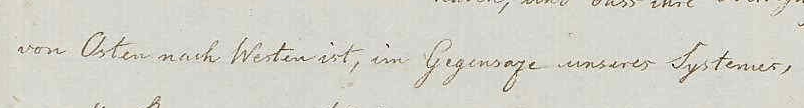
von Osten nach Westen ist, im Gegensaze unseres Systemes,
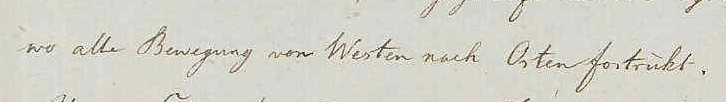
wo alle Bewegung von Westen nach Osten fortrükt.
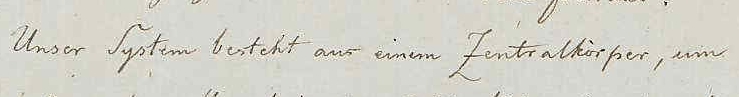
Unser System besteht aus einem Zentralkörper, um
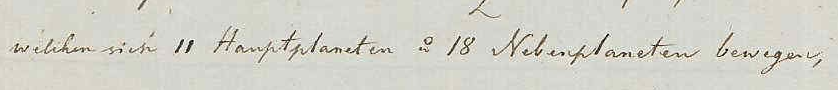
welchen sich 11 Hauptplaneten u 18 Nebenplaneten bewegen,
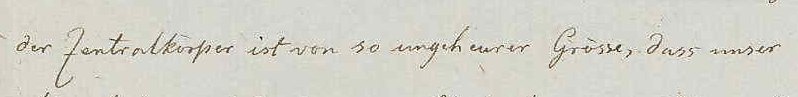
der Zentralkörper ist von so ungeheurer Grösse, dass unser
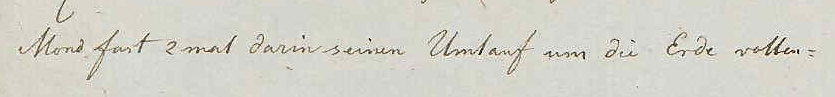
Mond fast 2 mal darin seinen Umlauf um die Erde vollen-
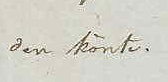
den könte.
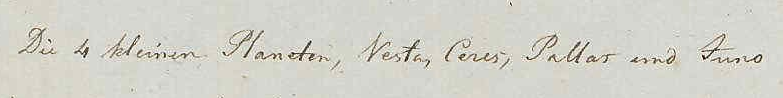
Die 4 kleinen Planeten, Vesta, Ceres, Pallas und Juno
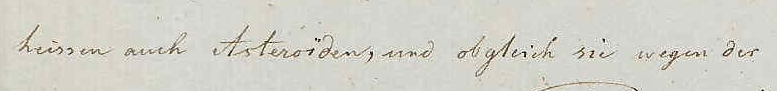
heissen auch Asteroïden, und obgleich sie wegen der
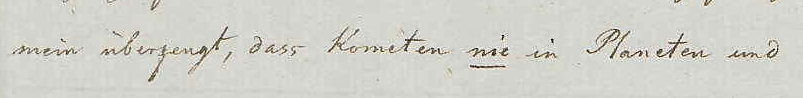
mein überzeugt, dass Kometen nie in Planeten und
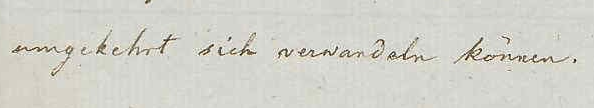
umgekehrt sich verwandeln können.
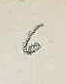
Bei
